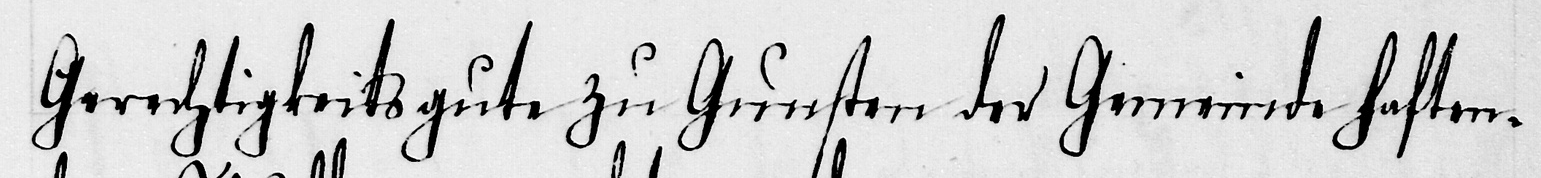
Gerechtigkeitsgute zu Gunsten der Gemeinde haften¬
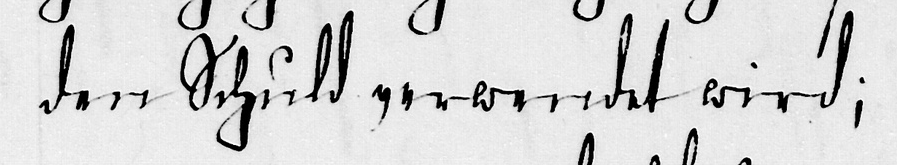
den Schuld verwendet wird;
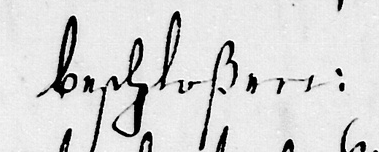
beschloßen:
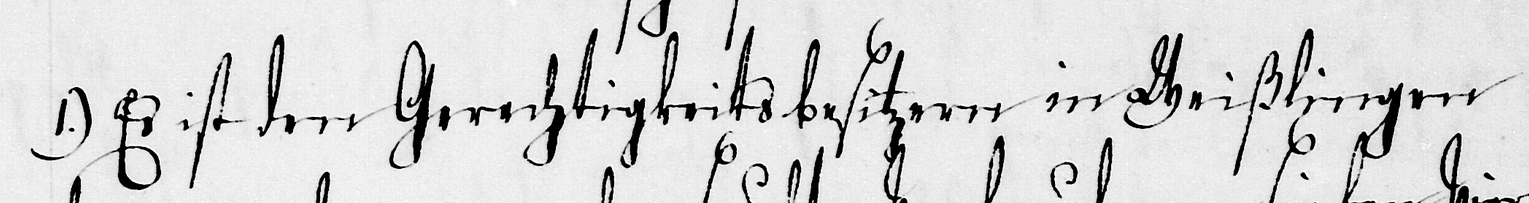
1.) Es ist den Gerechtigkeitsbesitzern in Weißlingen
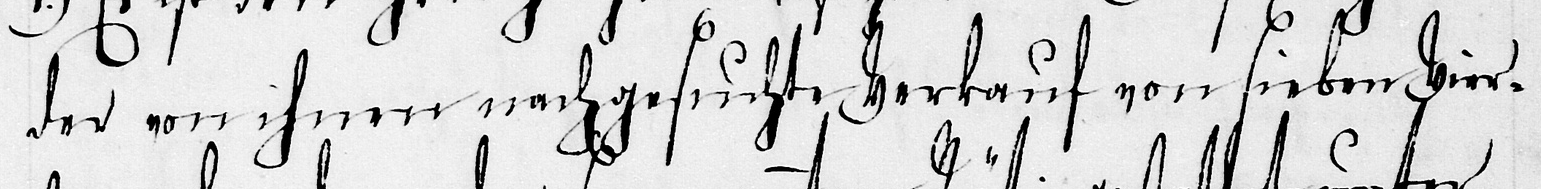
der von ihnen nachgesuchte Verkauf von sieben Vier¬
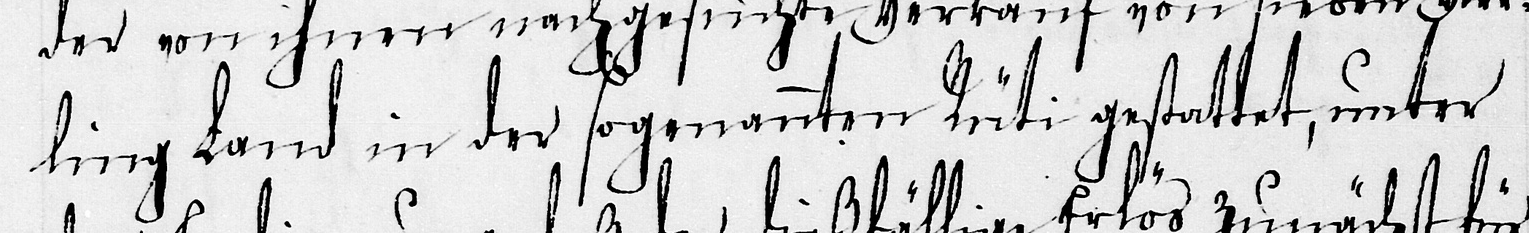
ling Land in der sogenannten Rüti gestattet, unter
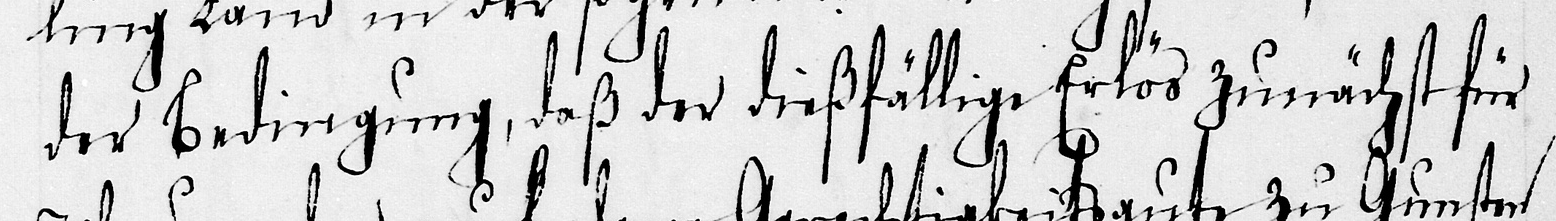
der Bedingung, daß der dießfällige Erlös zunächst für
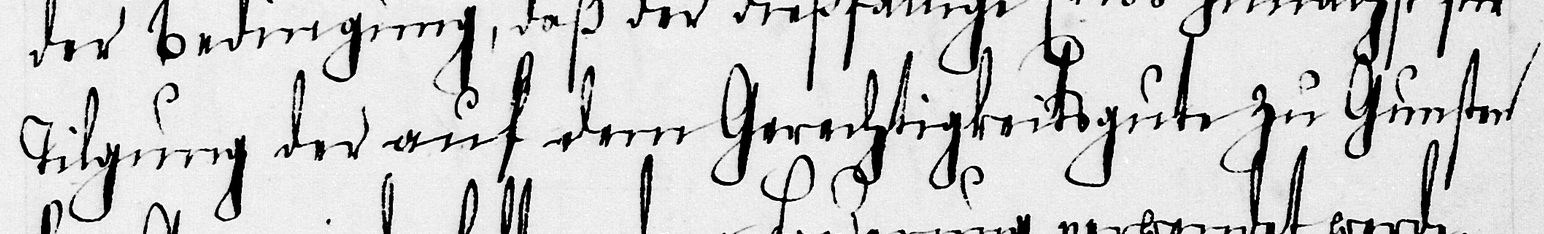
Tilgung der auf dem Gerechtigkeitsgute zu Gunsten
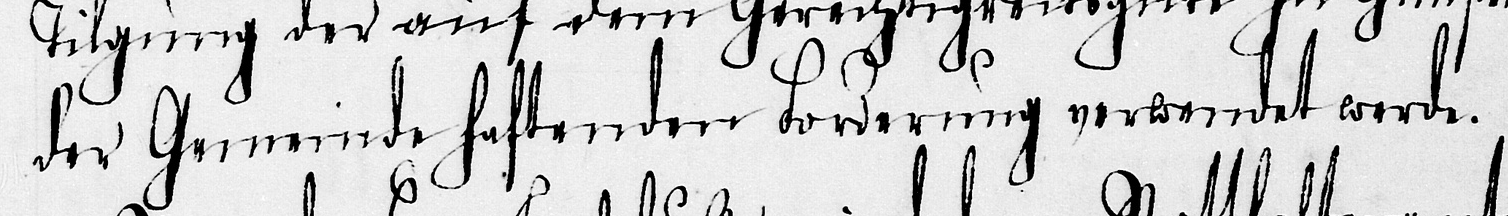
der Gemeinde haftenden Forderung verwendet werde.
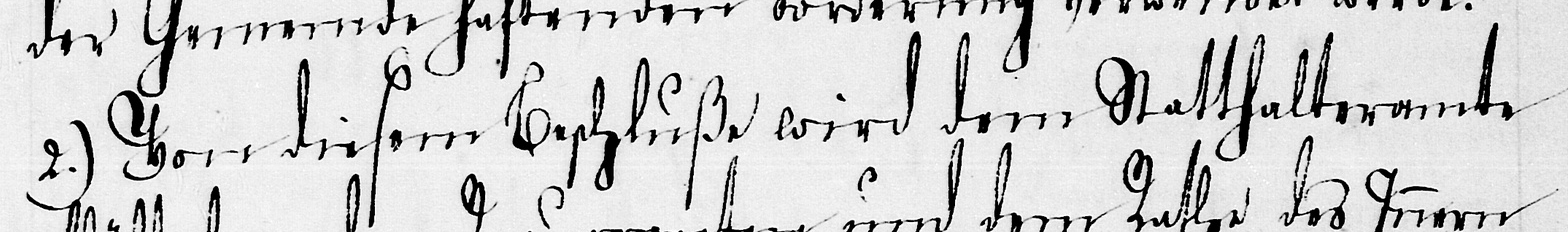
2.) Von diesem Beschluße wird dem Statthalteramte
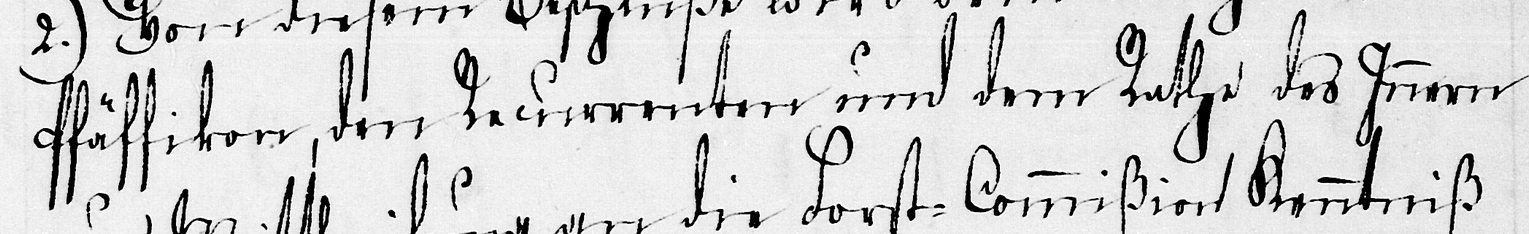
Pfäffikon, den Recurrenten und dem Rathe des Innern
